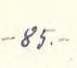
85.
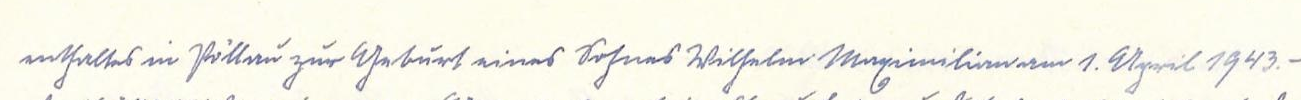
enthaltes in Pöllau zur Geburt eines Sohnes Wilhelm Maximilian am 1. April 1943.-
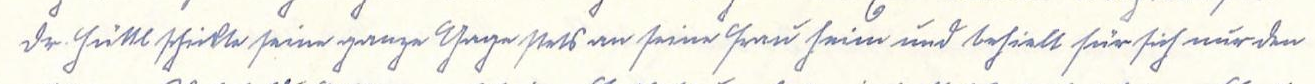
Dr. Hüttl schickte seine ganze Gage stets an seine Frau heim und behielt fürsich nur den
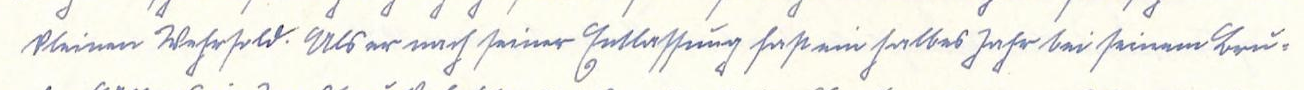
kleinen Wehrsold. Als er nach seiner Entlassung fast ein halbes Jahr bei seinem Bru-
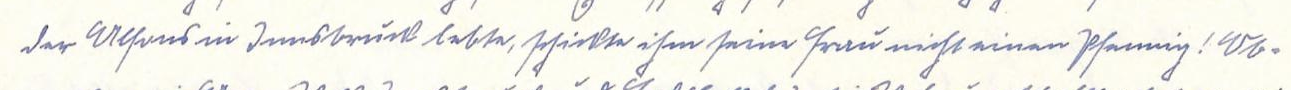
der Alfons in Innsbruck lebte, schickte ihm seine Frau nicht einen Pfennig! Ob-
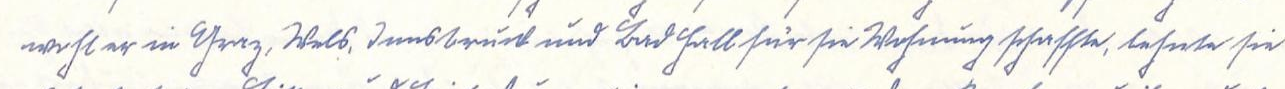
wohl er in Graz, Wels, Innsbruck und Bad Hall für sie Wohnung schaffte, lehnte sie
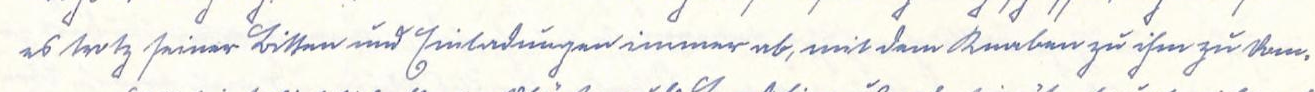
es trotz seiner Bitten und Einladungen immer ab, mit dem Knaben zu ihm zu kom-
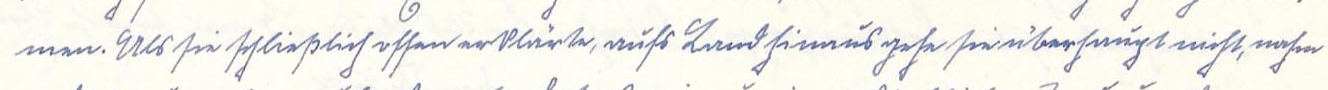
men. Als sie schließlich offen erklärte, aufs Land hinaus gehe sie überhaupt nicht, nahm
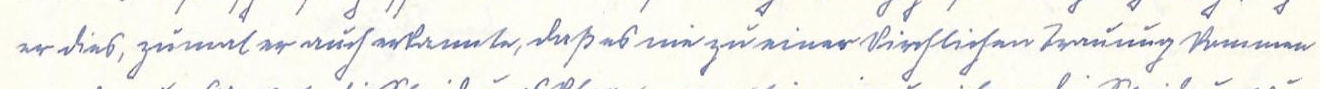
er dies, zumal er auch erkannte, daß es nie zu einer kirchlichen Trauung kommen
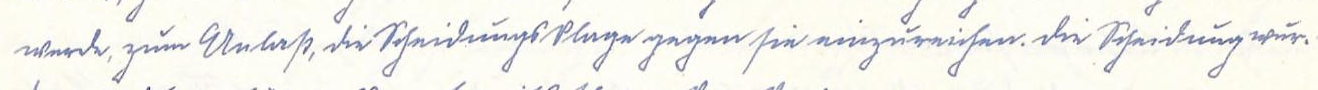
werde, zum Anlasß die Scheidungsklage gegen sie einzureichen. Die Scheidung wur-
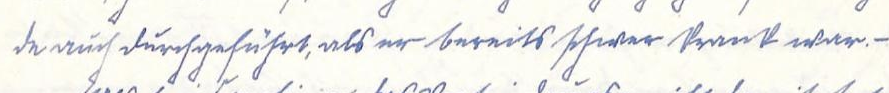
de auch durchgeführt, als er bereits schwer krank war.-
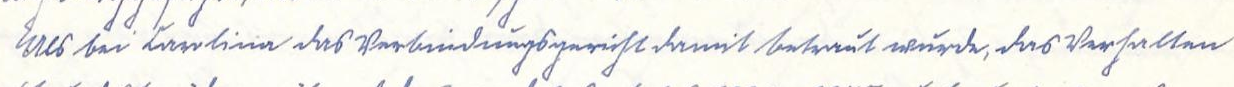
Als bei Carolina das Verbindungsgericht damit betraut wurde, das Verhalten
